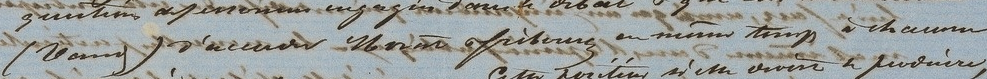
(Vaud) d'accorder Morat–Fribourg en même temps à chacune
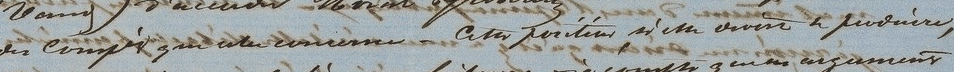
des Compies que cela concerne – Cette position, si elle devait se produire,
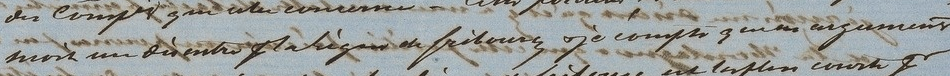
serait un désastre pour la Ligne de Fribourg & je compte que ces arguments
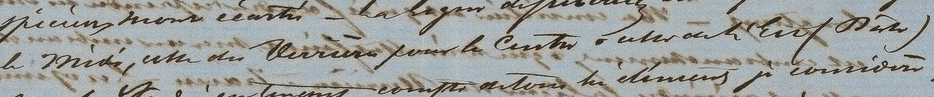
le Midi, celle des Verrières pour le Centre & celle de l' Est (Bâle)
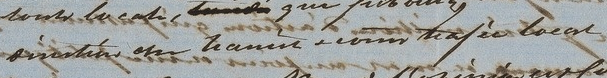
direction du transit & comme trafic local –
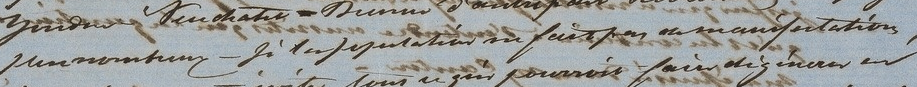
plus nombreux – Si la population ne fait pas de manifestations,
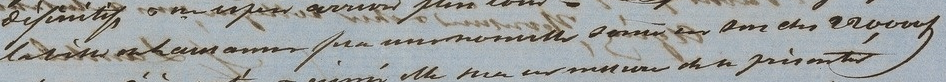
la ville de Lausanne fera une nouvelle somme en sus des 220,000 francs
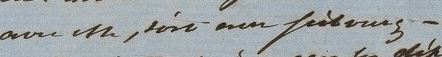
avec elle, soit avec Fribourg –
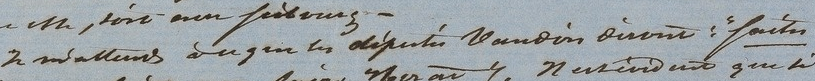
Je n'attends à ce que les députés Vaudois diront: «Faites
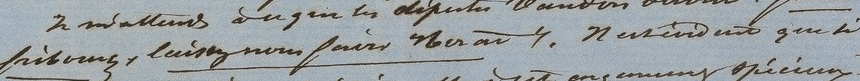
Fribourg & laissez nous faire Morat». Il est évident que si
